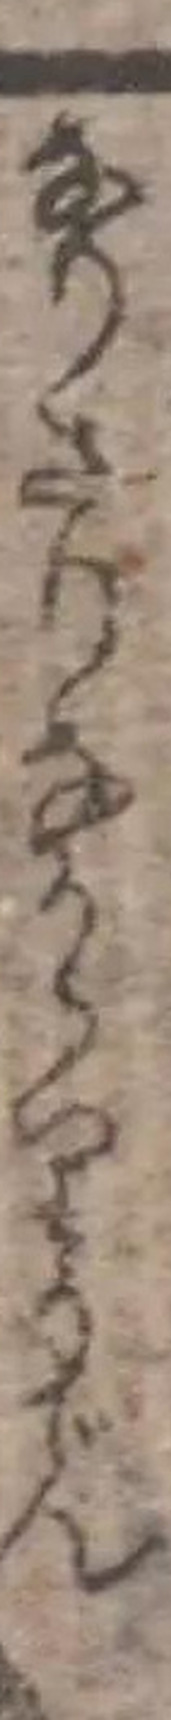なりさりなからりうじん
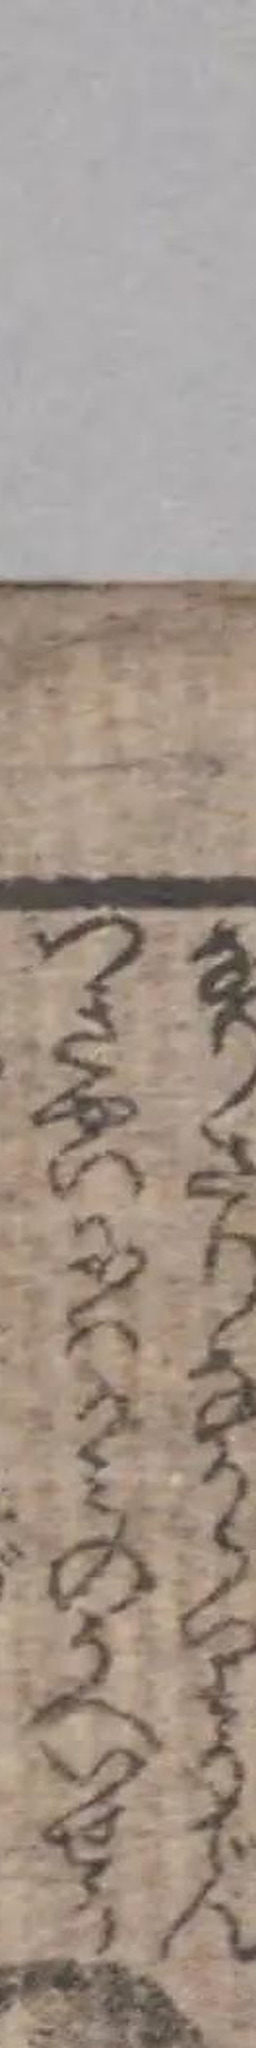つきやいにハかミのうへいせう
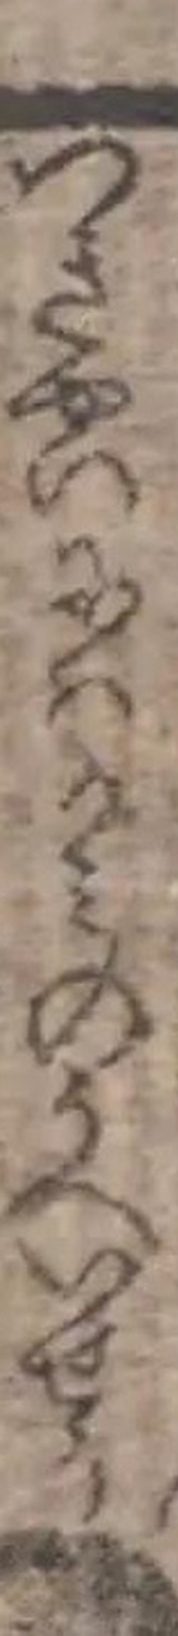つきやいにハかミのうへいせう
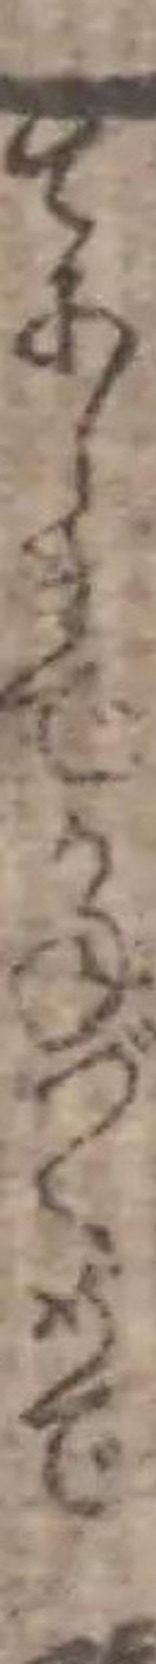てあしまでかねづくめで
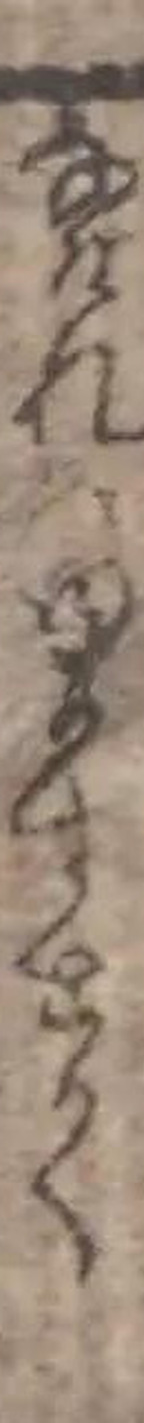なけれハゆかすとかく
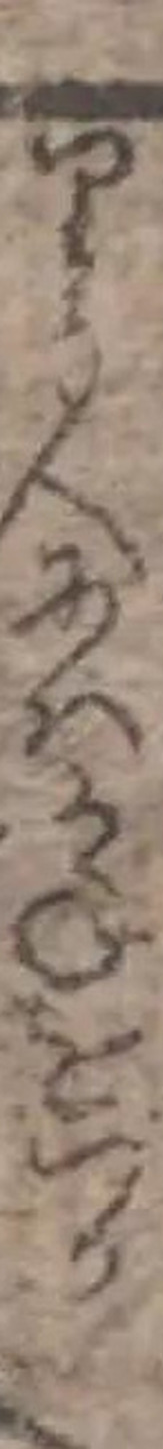りう人にハかねをつか
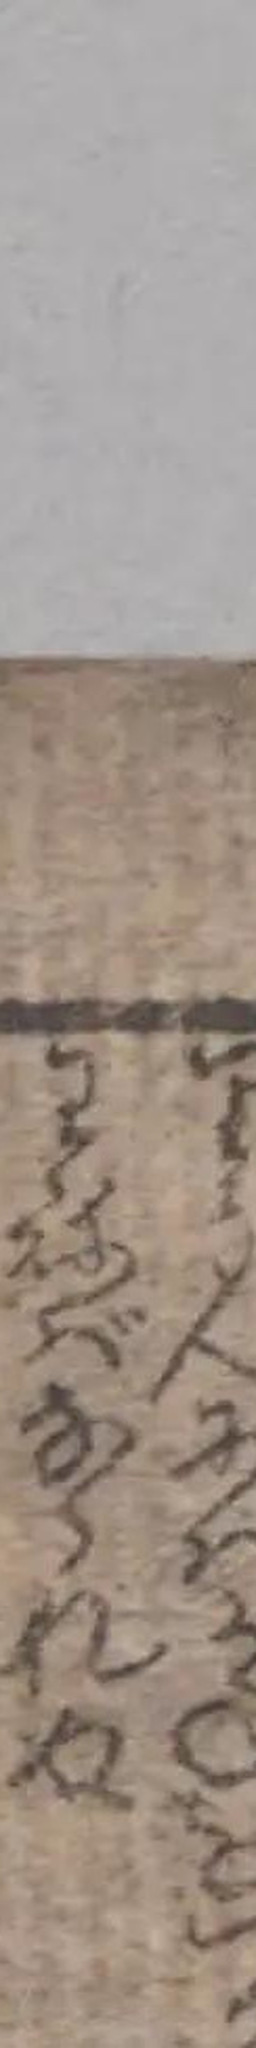わねばなられぬ
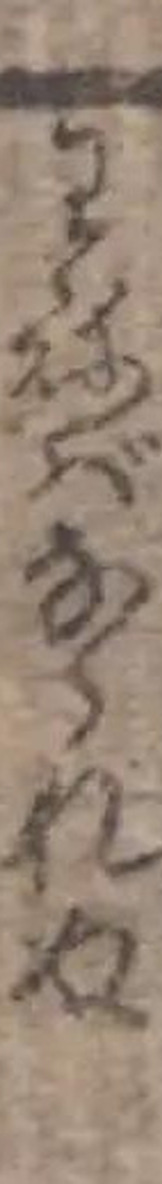わねばなられぬ
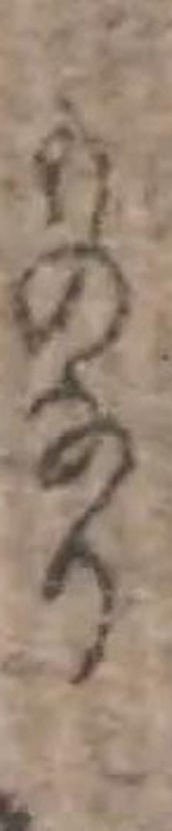ものなり
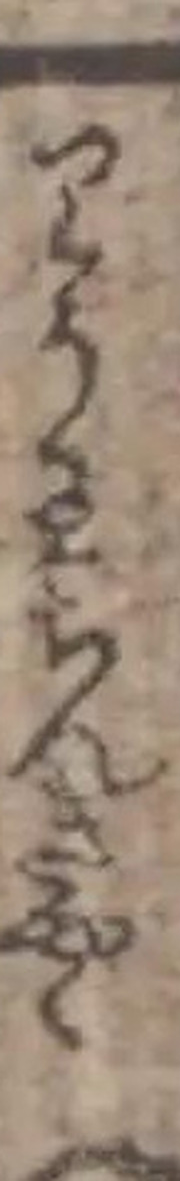りう王ちんきやく
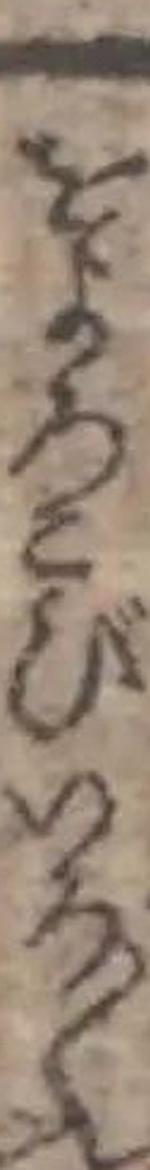をよろこびいろ〳〵
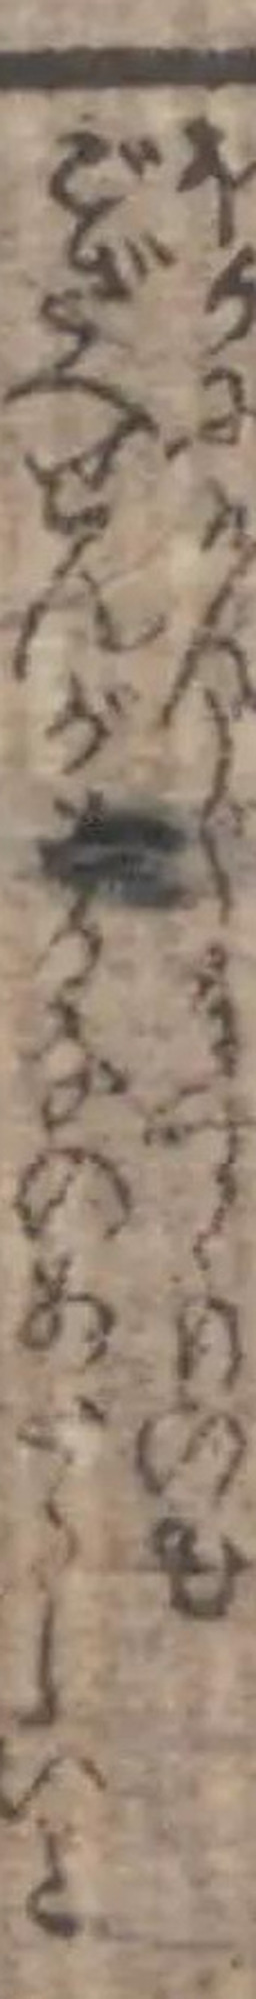ござへせんがかなのめらしいと
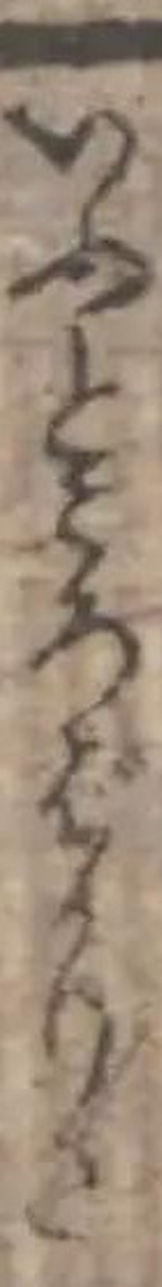いふところばかりさ
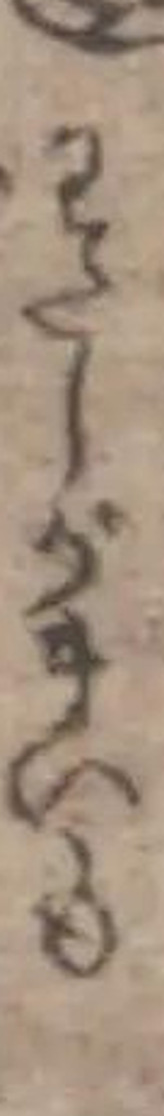わたしがまいも
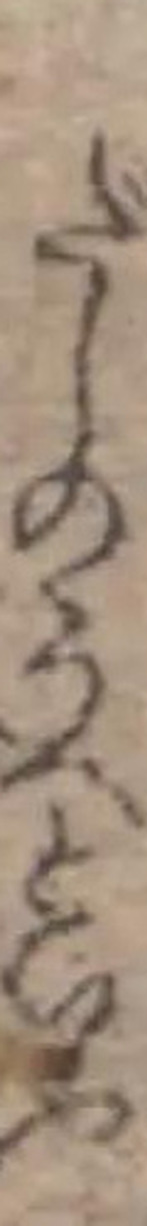だしのうえといふ
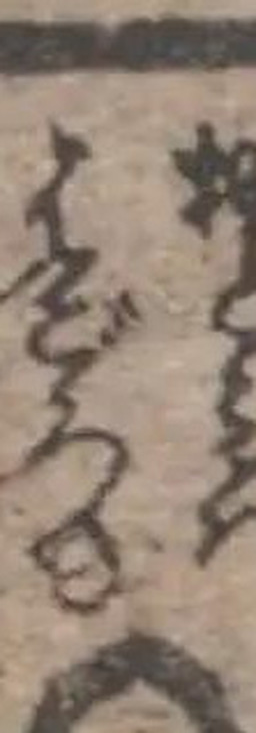はごろも
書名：草紙の曙 3巻
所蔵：国立国会図書館 National Diet Library, JAPAN
